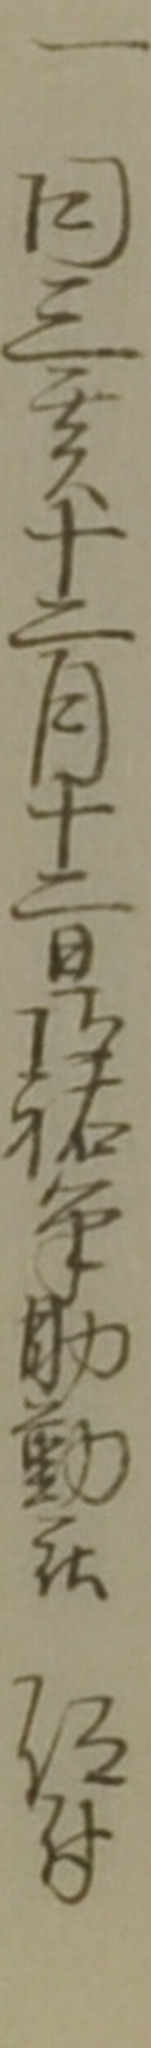一同三亥十二月十二日御祐筆助勤被仰付
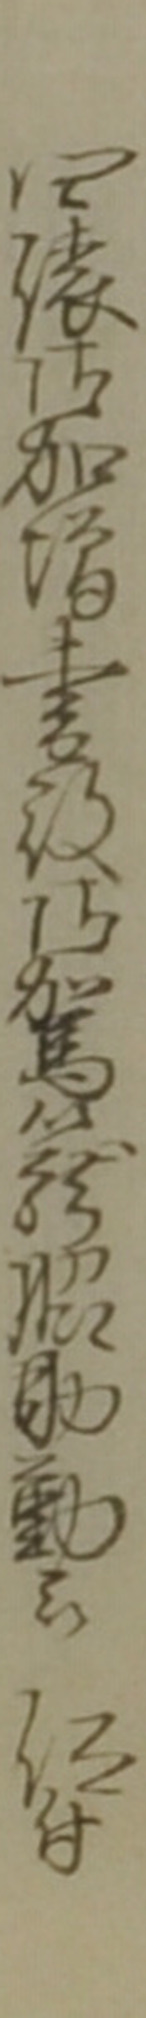四俵御加増書役御駕籠脇助勤被仰付
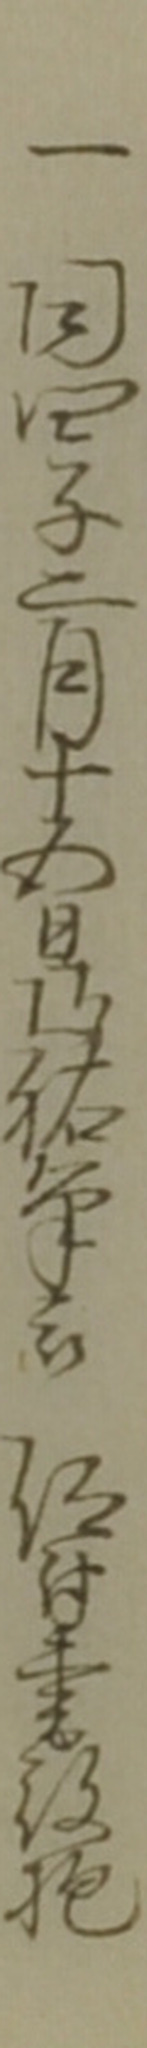一同四子二月十五日御祐筆被仰付書役抱
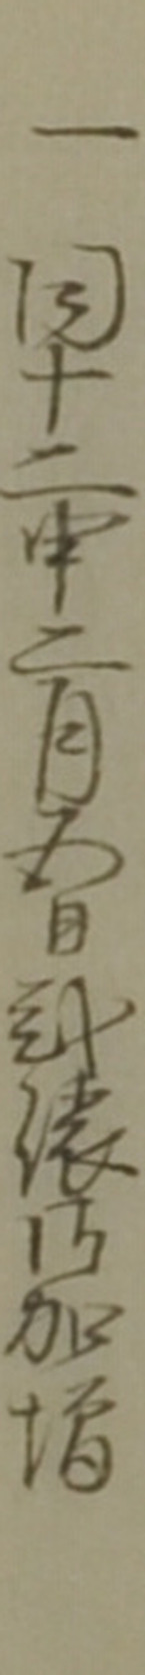一同十二申二月五日弐俵御加増
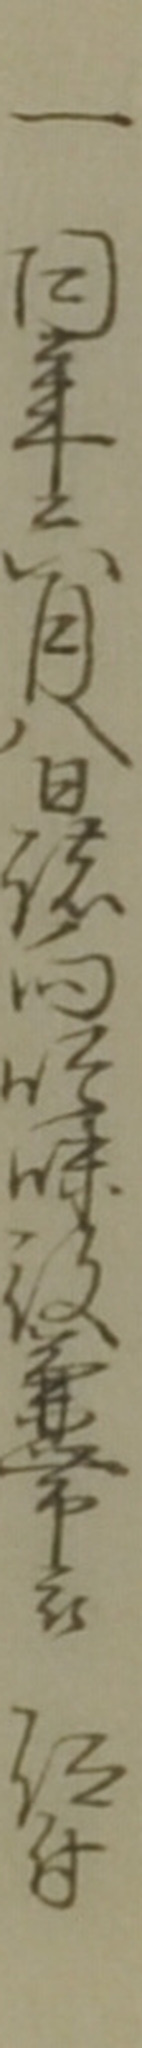一同年六月八日諸向吟味役兼帯被仰付
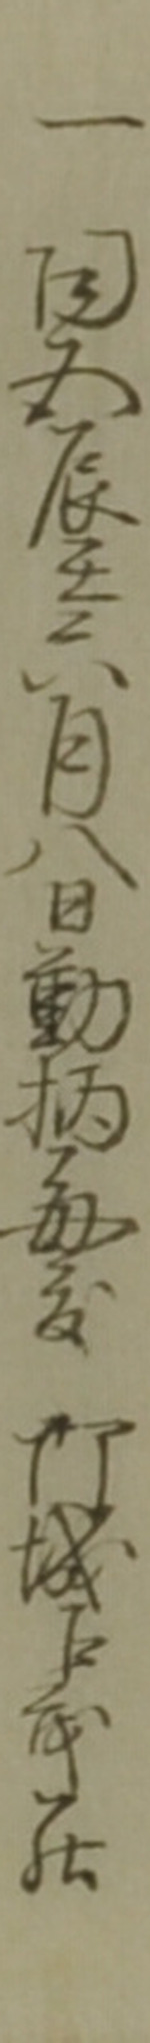一同五辰閏六月八日勤柄毎度御城江も罷
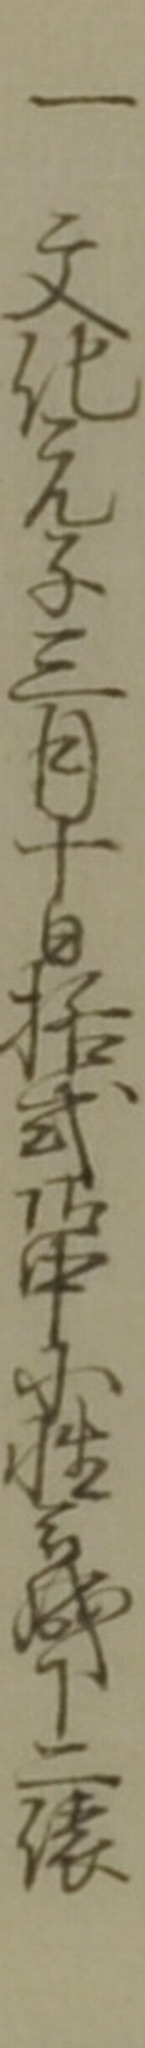一文化元子三月十日格式御中小性被成下二俵
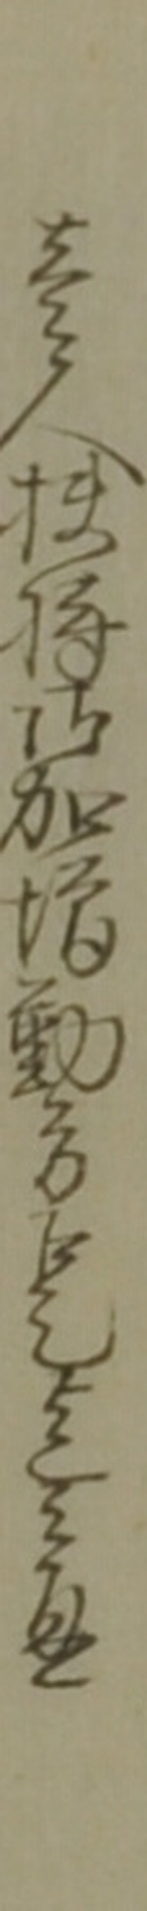壱人扶持御加増勤方是迄之通
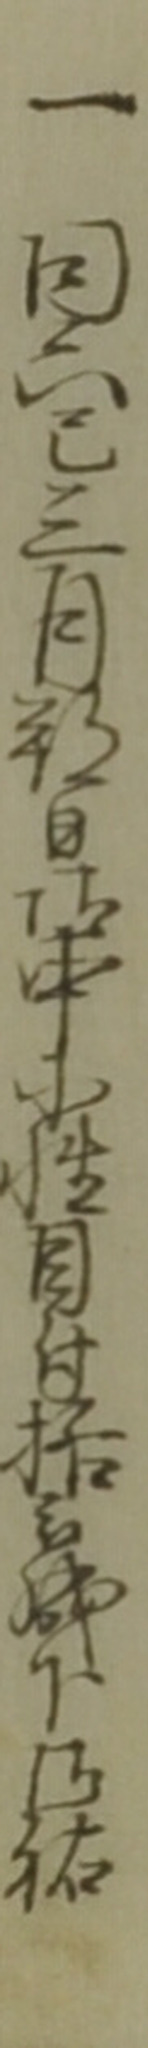一同六巳三月朔日御中小性目付格被成下御祐
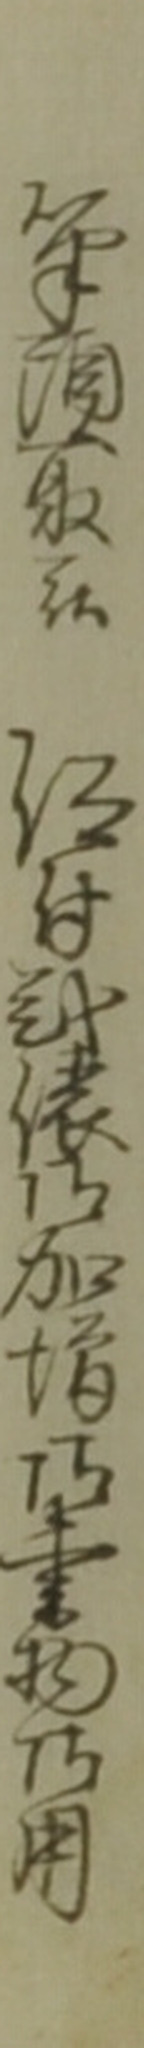筆頭取被仰付弐俵御加増御書物御用
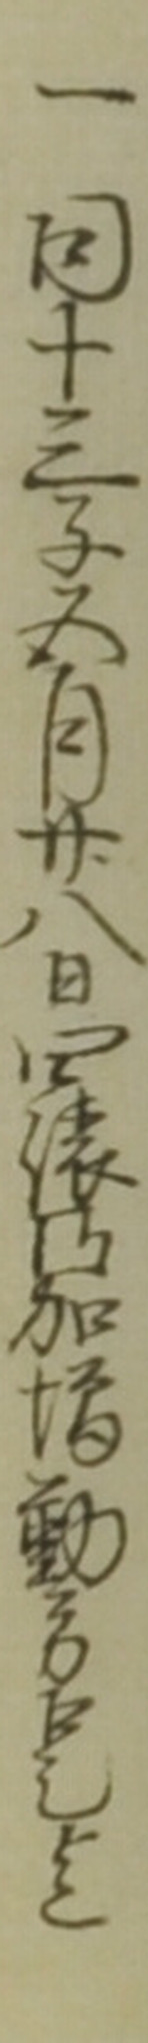一同十三子五月廿八日四俵御加増勤方是迄
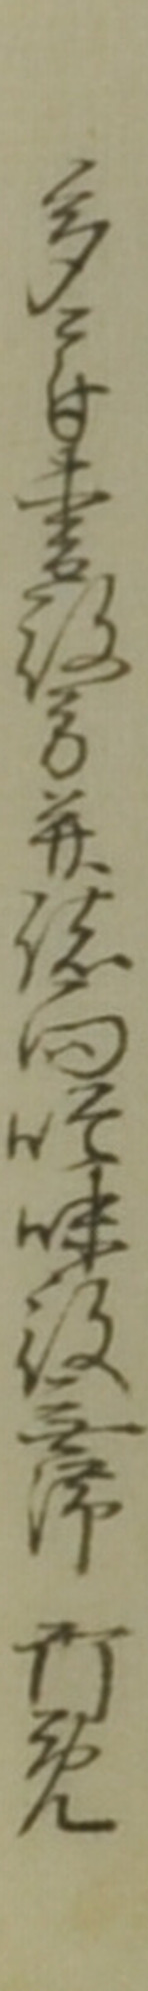多ニ付書役方并諸向吟味役無滞御免

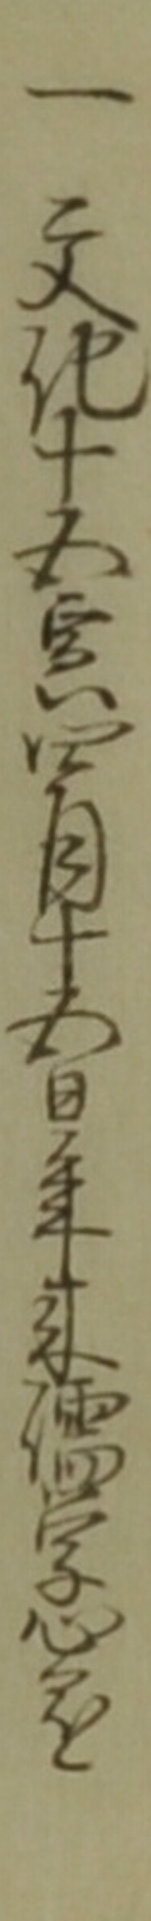一文化十五寅四月十五日年来儒学心懸
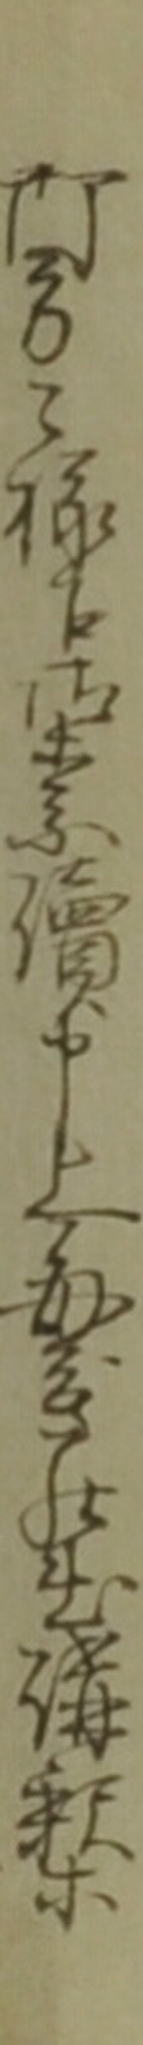御方々様江御素読申上毎度罷出講釈等
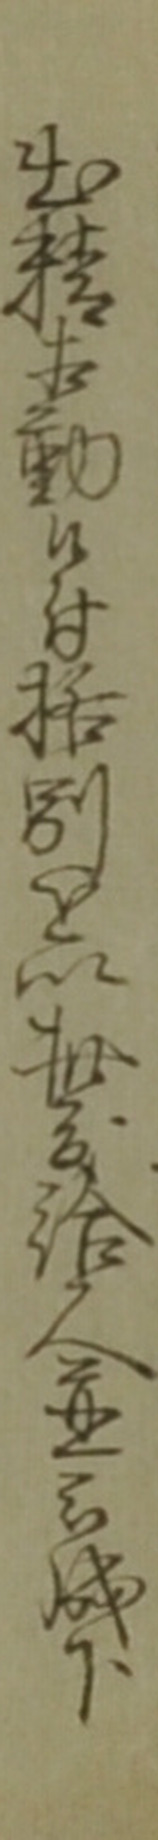出精相勤候付格別を以此度給人並被成下
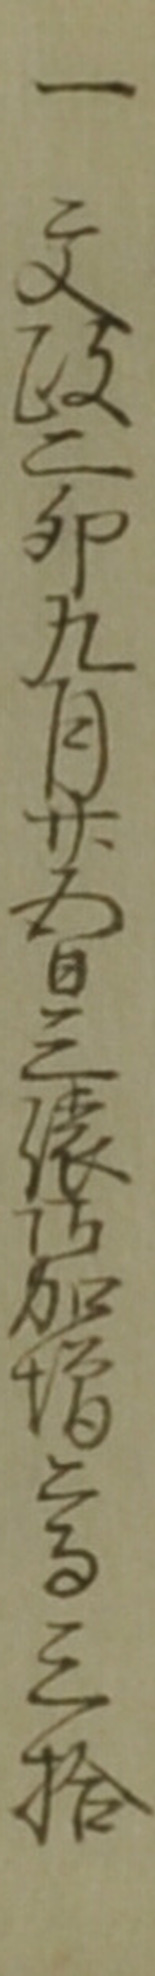一文政二卯九月廿五日三俵御加増高三拾
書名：無足廃家（弐）
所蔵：伊那市立高遠町図書館・合同会社AMANE
